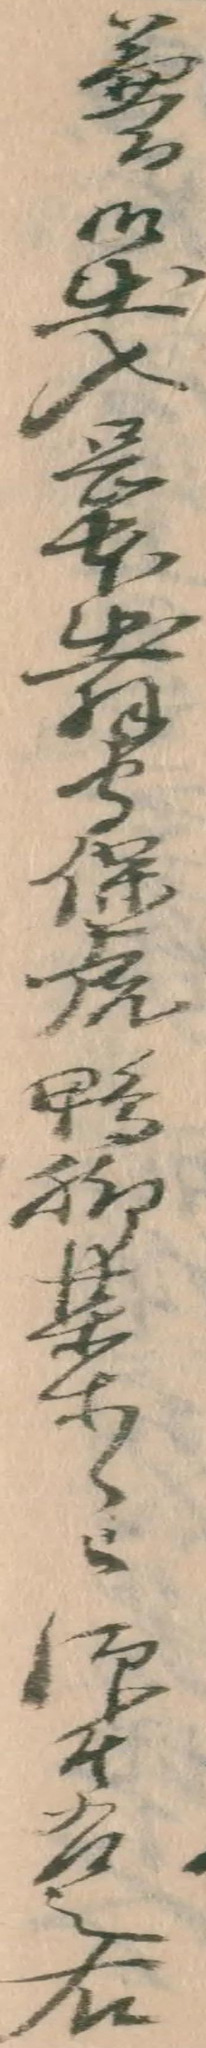兼而御出入岡本出羽守保虎鴨脚何某等へ被仰付有之右
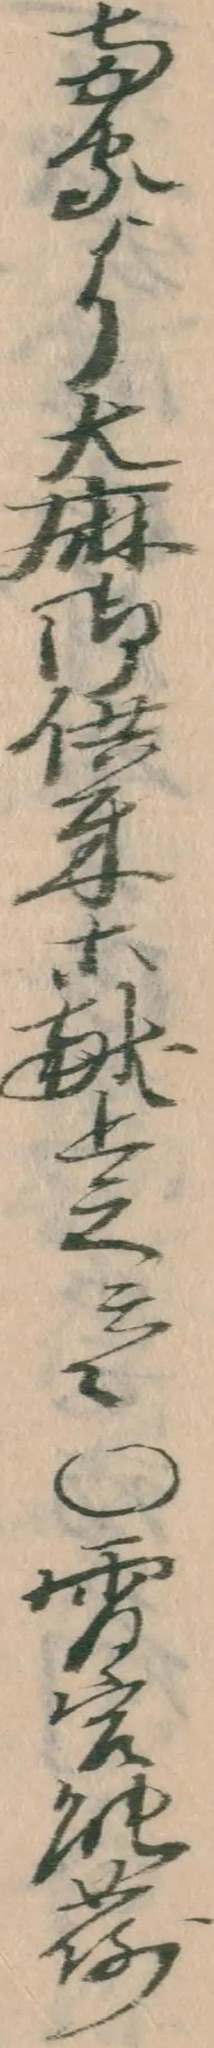両家より大麻御供米等献上之云々○宵宮能如例
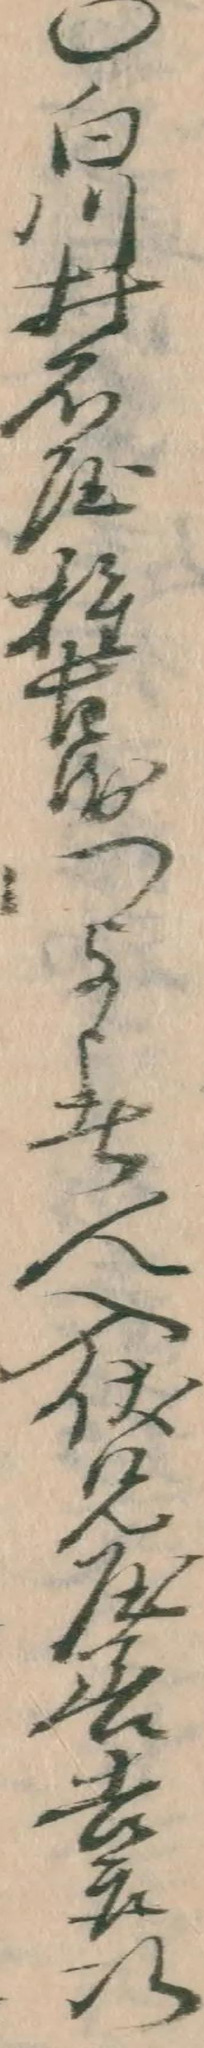○白川村名屋権左衛門と申者人入伏見屋善吉取次
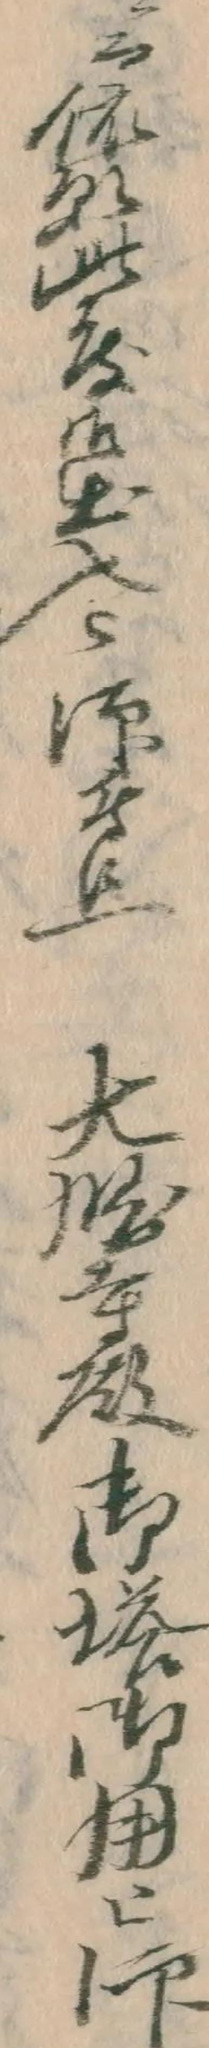ニ而依願此度御出入被仰ニ付且大勝寺殿御塔御用被仰
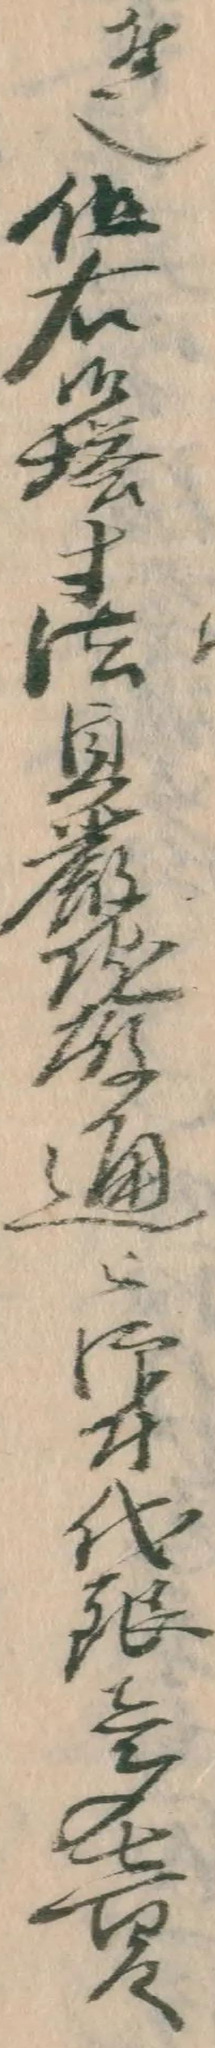付也但右御塔寸法貞厳院殿通被仰付代銀壱〆七百匁
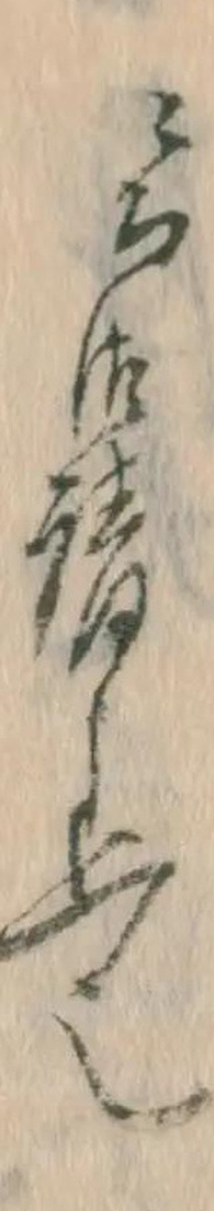ニ而御請申上也
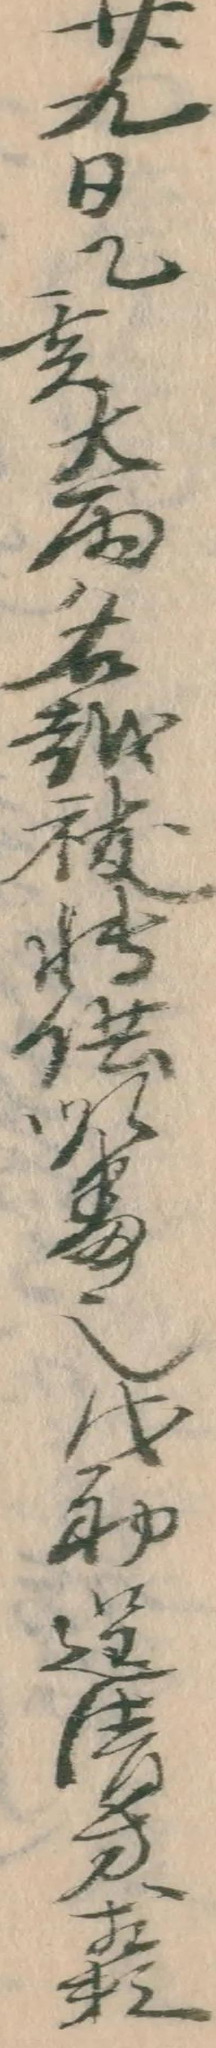廿九日乙亥大雨名越祓轉供順番也代勤逞清方相頼
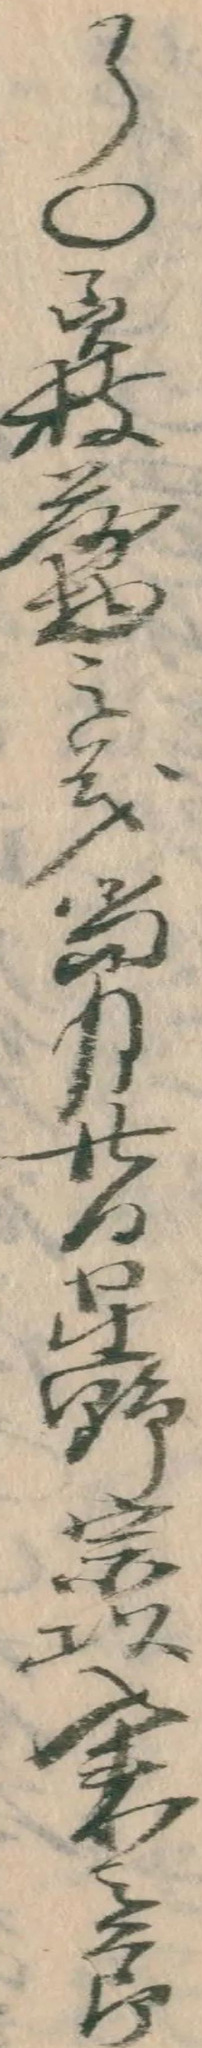了〇美枝荷物之義當月廿日星野宗以入来之節
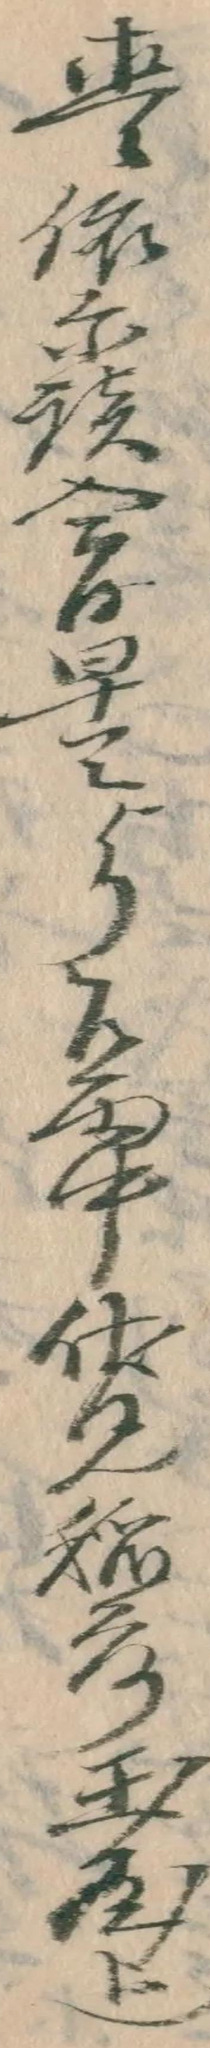直々依示談今日早天より乍雨中伏見稲荷玉屋迄
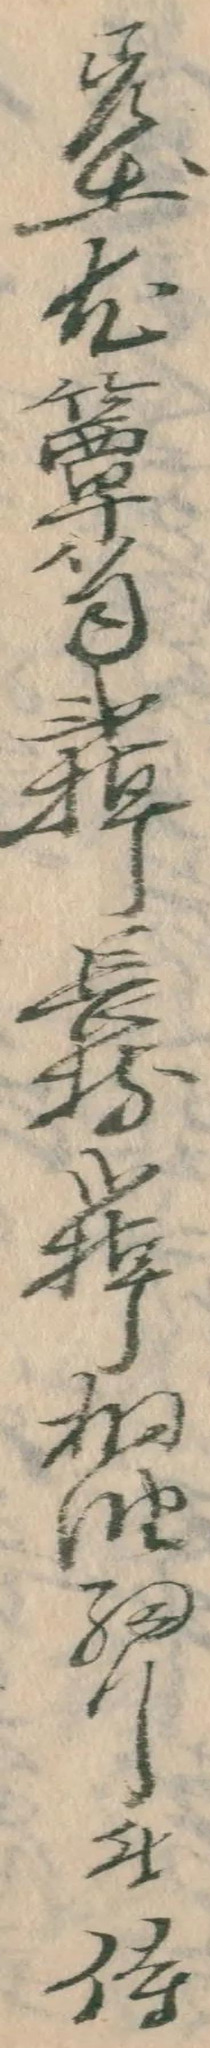差出尤箪笥弐棹長持弐棹桐相引付侍
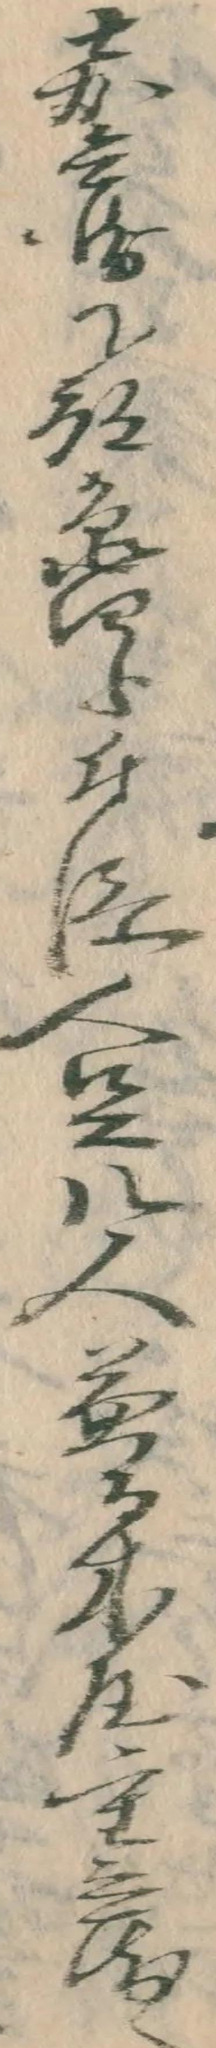嘉兵衛下部亀四郎付添人足八人兼而木屋重兵衛へ
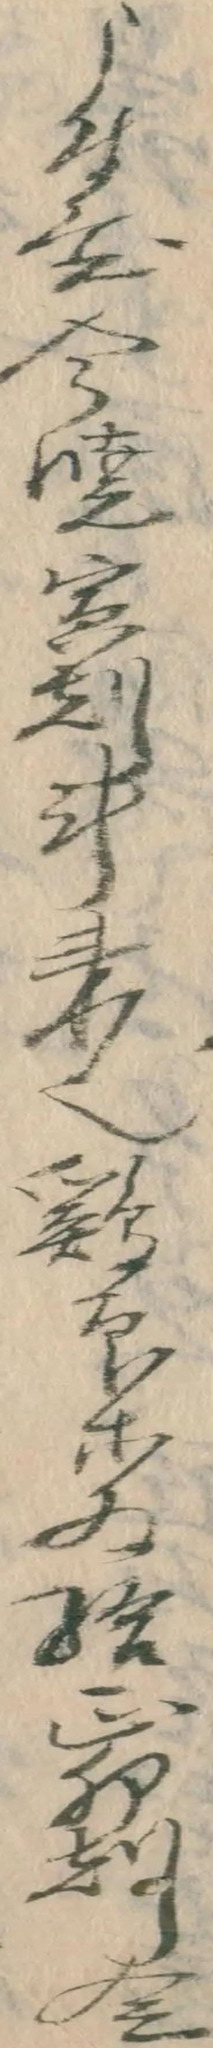申付置今暁寅刻斗来也鶏本等為始正卯刻令
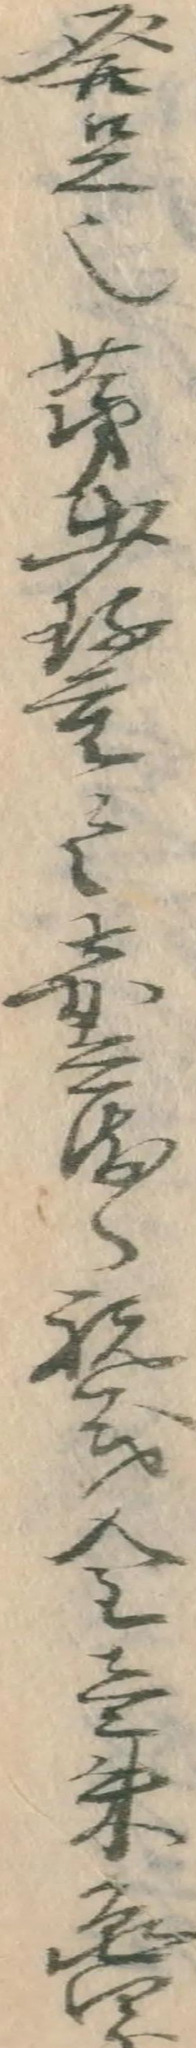発足也茅出珍重にて嘉兵衛へ祝義金壱朱亀四郎

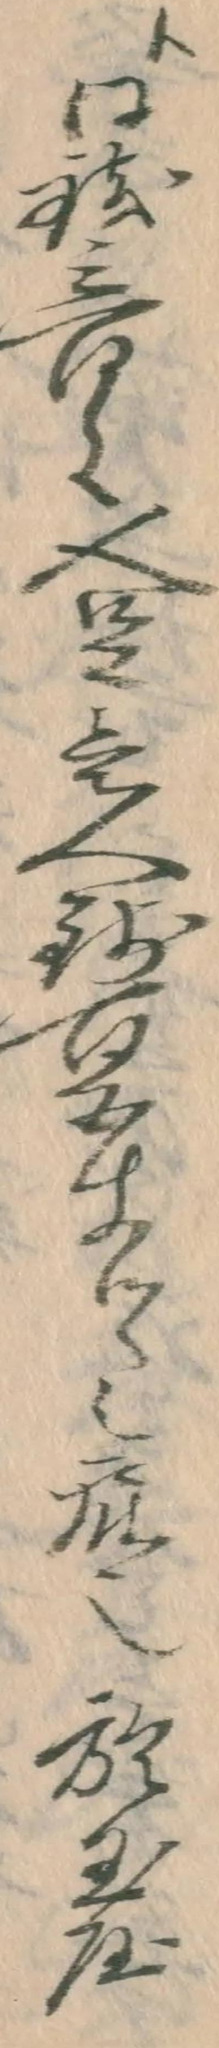ト同銭三百文人足壱人銭百五十文ツヽ之雇也於玉屋
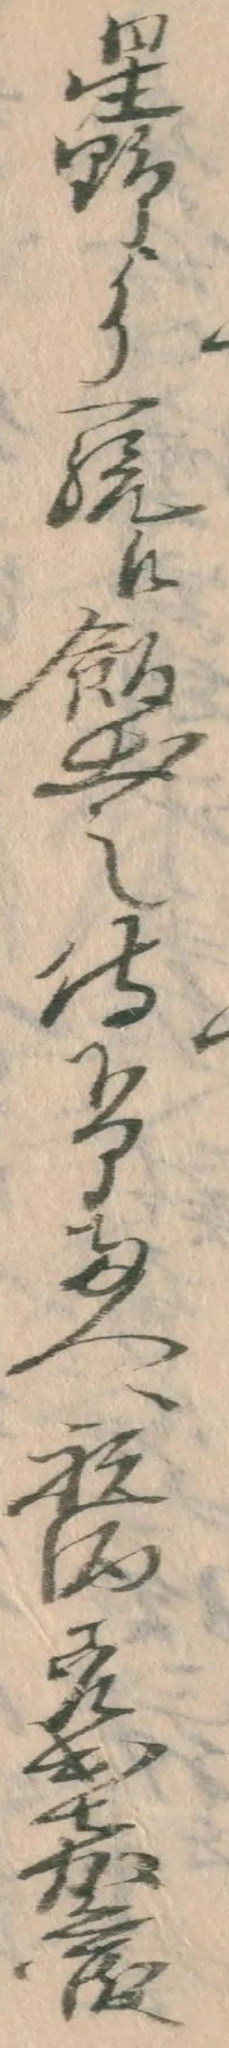星野より一統え飯出し侍下部両人へ祝酒差出嘉兵衛
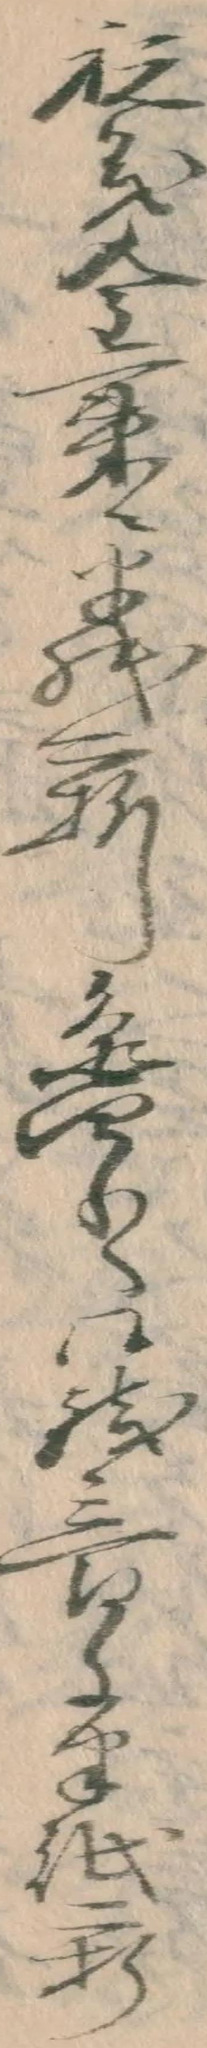祝義金一朱ニ半紙二折糸四分へ同銭三百文半紙ニ折
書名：賀茂社記録. 第67冊
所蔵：国立国会図書館 National Diet Library, JAPAN
